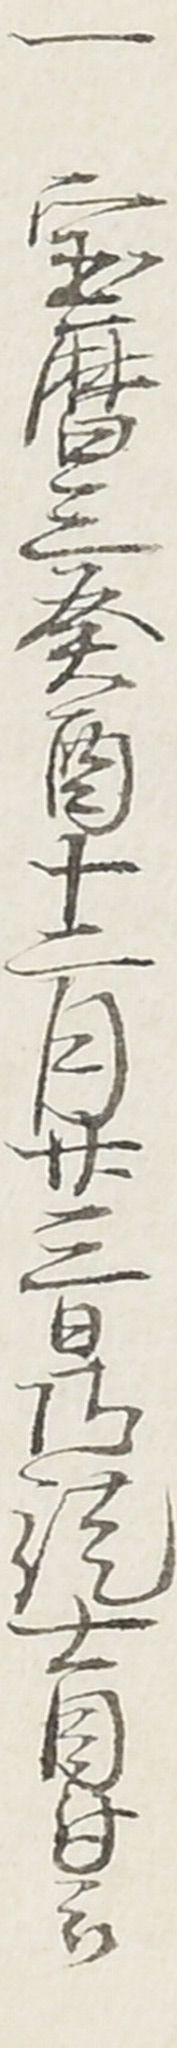一宝暦三癸酉十二月廿三日御徒士目付被
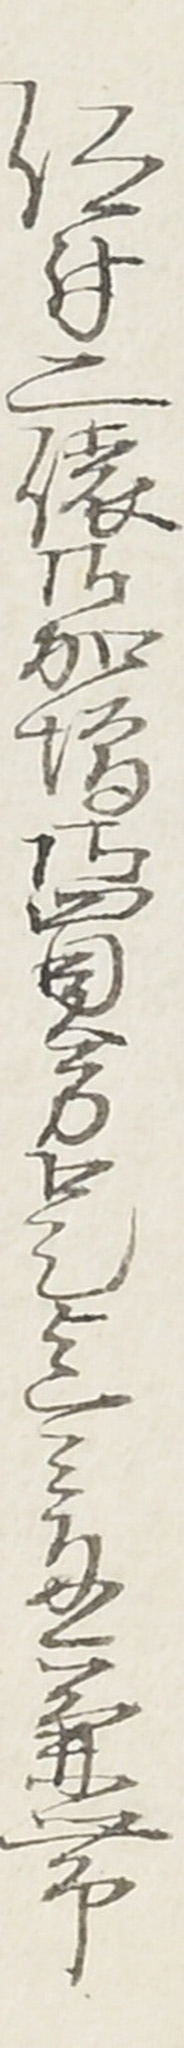仰付二俵御加増御買方是迄之通兼帯
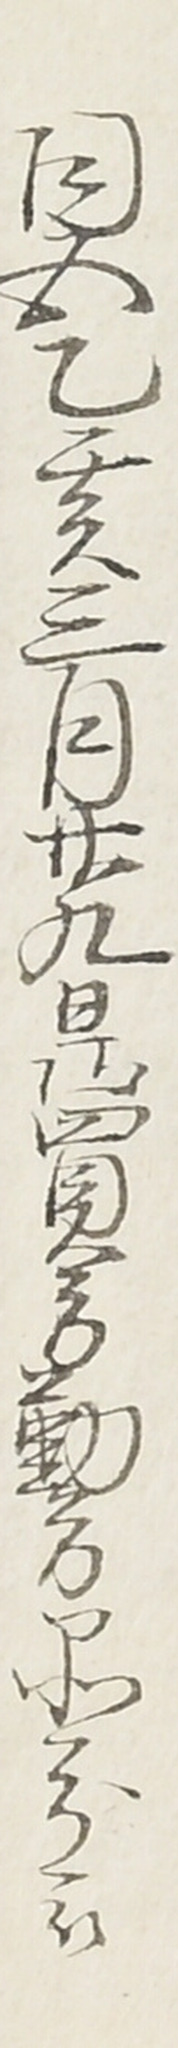一同五乙亥三月廿九日御買方勤方品分被
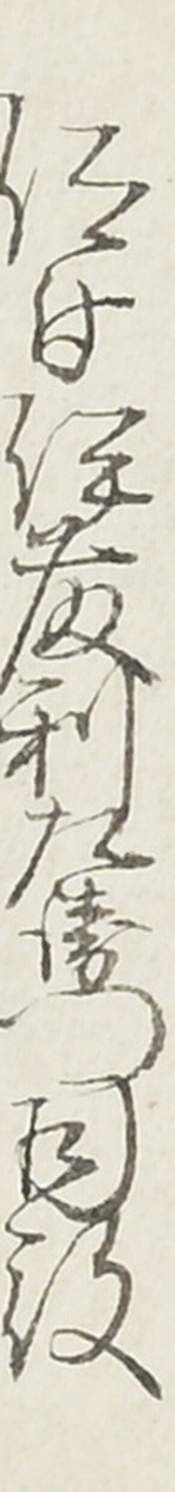仰付伊藤利左衛門同役
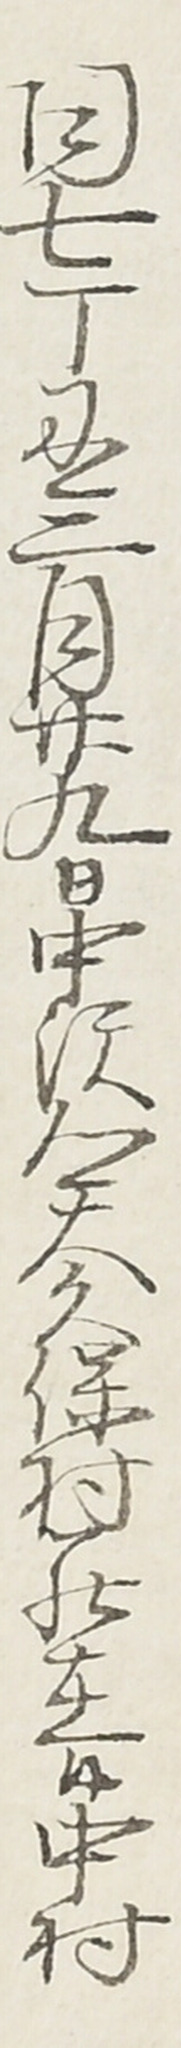一同七丁丑二月廿九日中沢郷大久保村罷在候中村
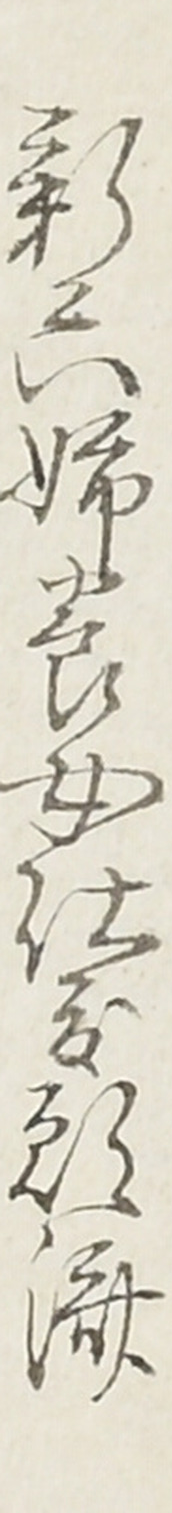新六姉養女仕度願済
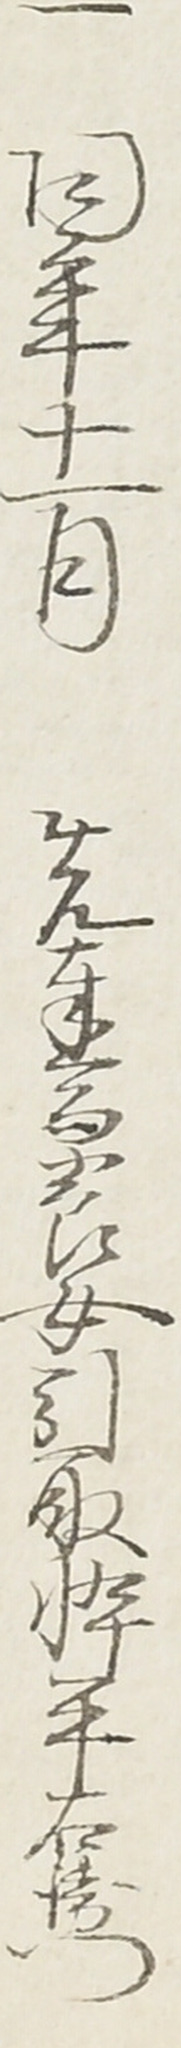一同年十一月先達而養女引取忰平右衛門
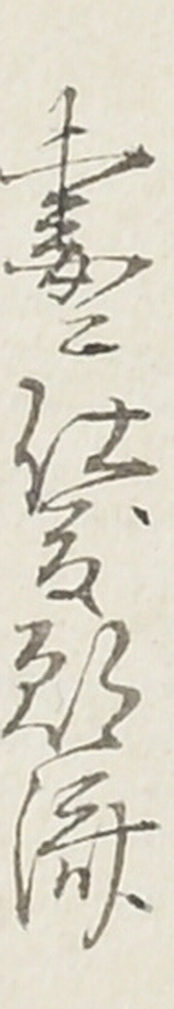妻二仕度願済
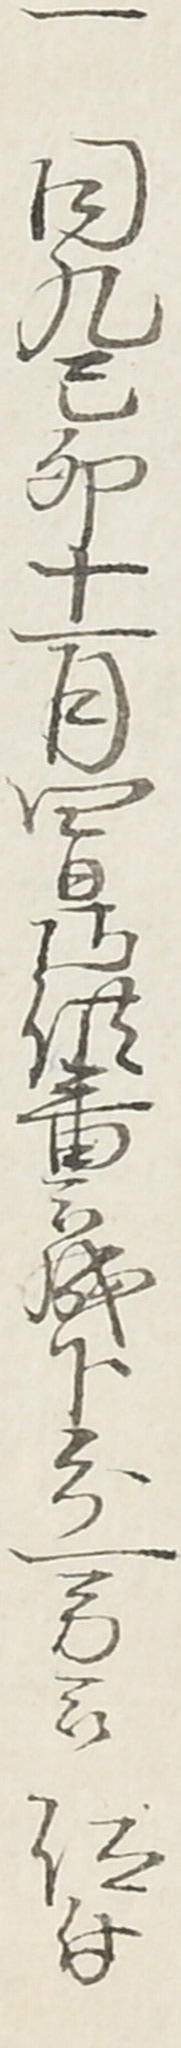一同九己卯十一月四日御供番被成下分一方被仰付
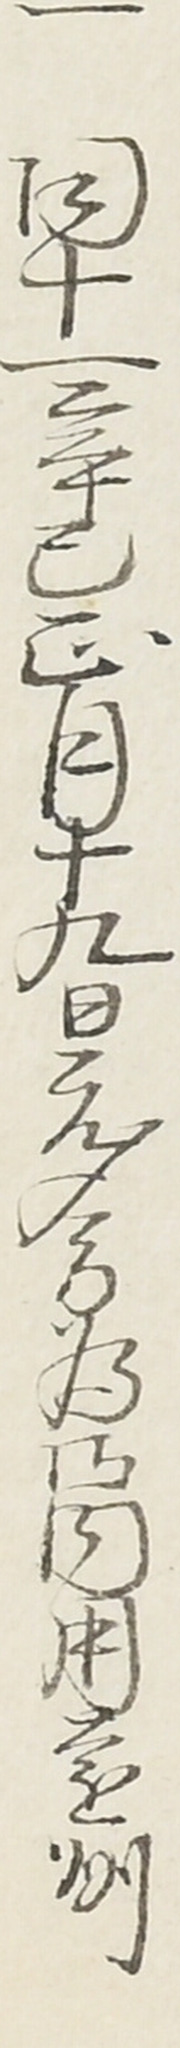一同十一辛巳正月十九日元〆方為御内用遠州
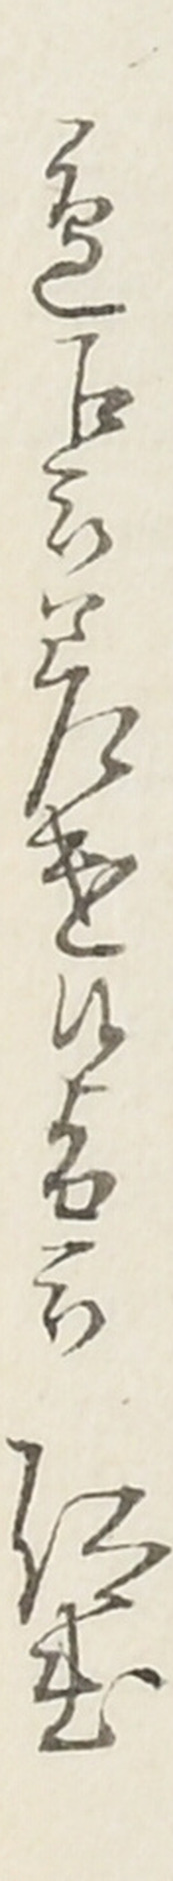邊江被差遣候旨被仰出

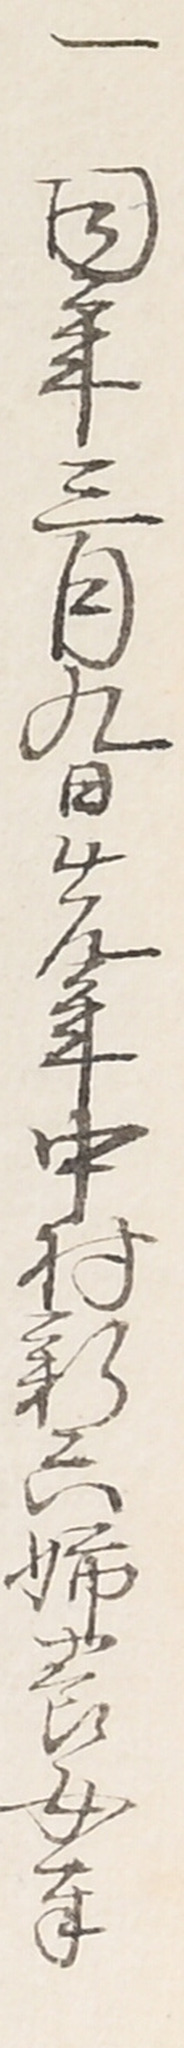一同年三月九日先年中村新六姉養女奉
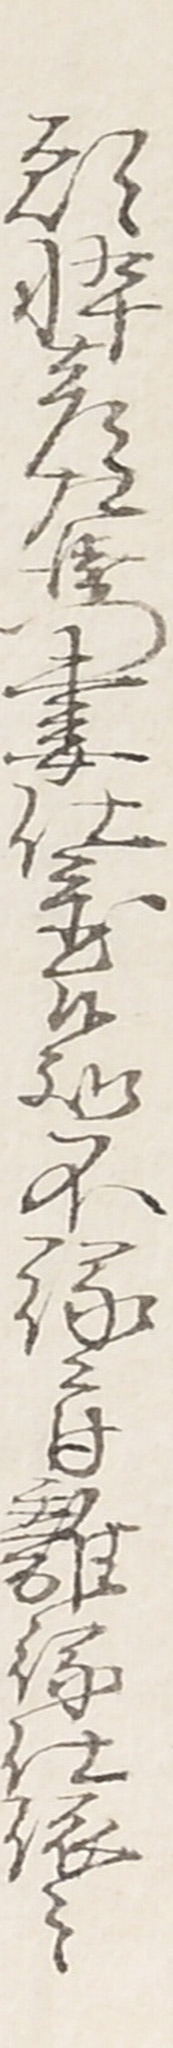願忰彦左衛門妻仕置候処不縁二付離縁仕依之
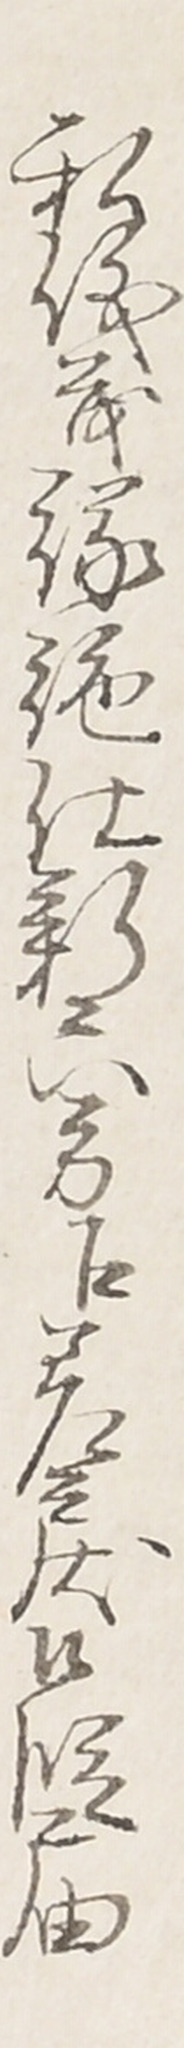私儀茂縁絶仕新六方江差戻候段届
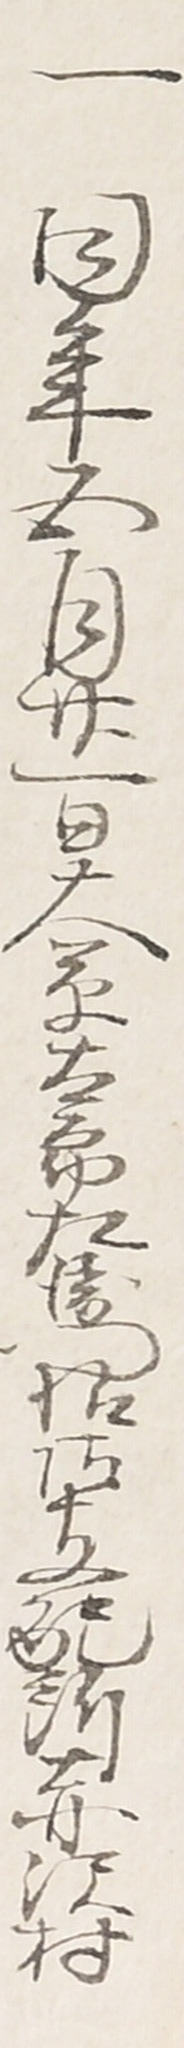一同年五月廿一日大草太郎左衛門様御支配所赤沢村
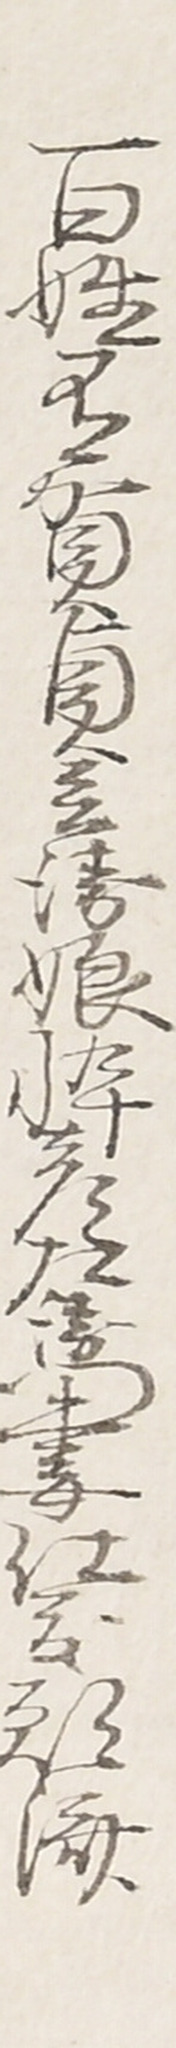百姓有賀貞兵衛娘忰彦左衛門妻仕度願済
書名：無足諸士勤仕録（四）
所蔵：伊那市立高遠町図書館・合同会社AMANE
